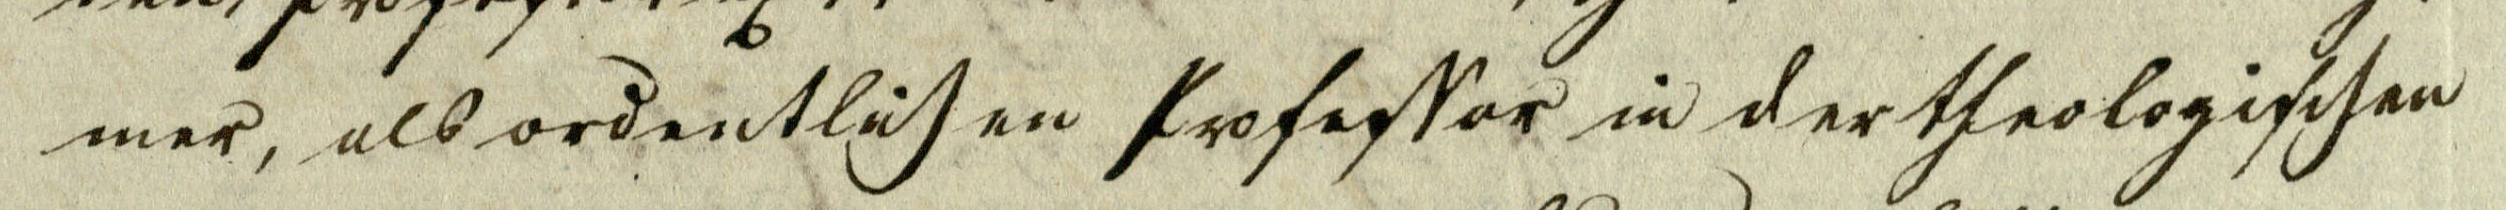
mer, als ordentlichen Professor in der theologischen
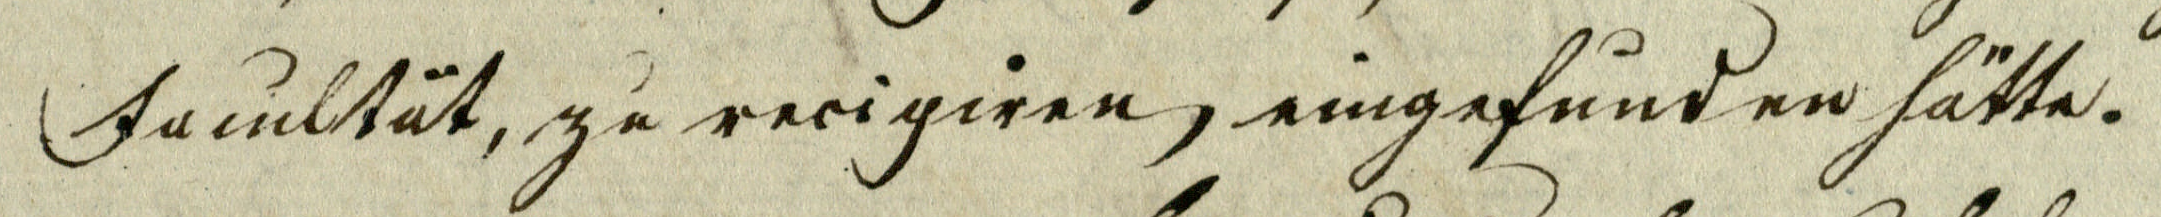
Facultät zu recipiren, eingefunden hätte.
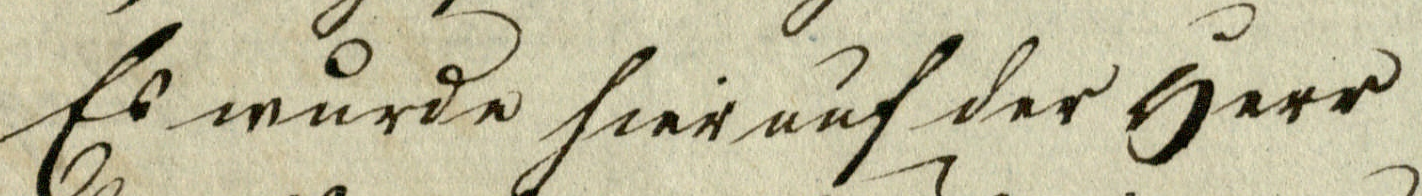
Es wurde hierauf der Herr
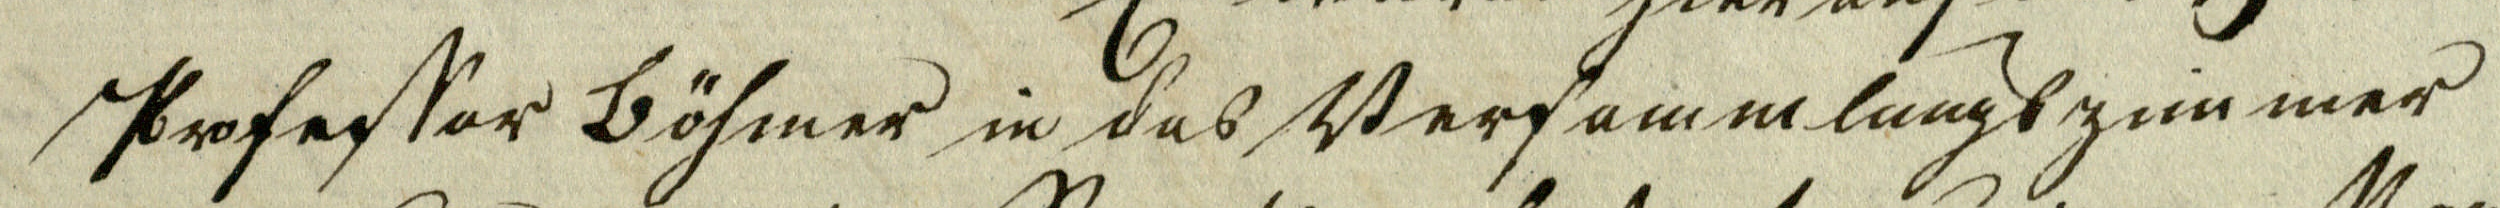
Professor Böhmer in das Versammlungszimmer
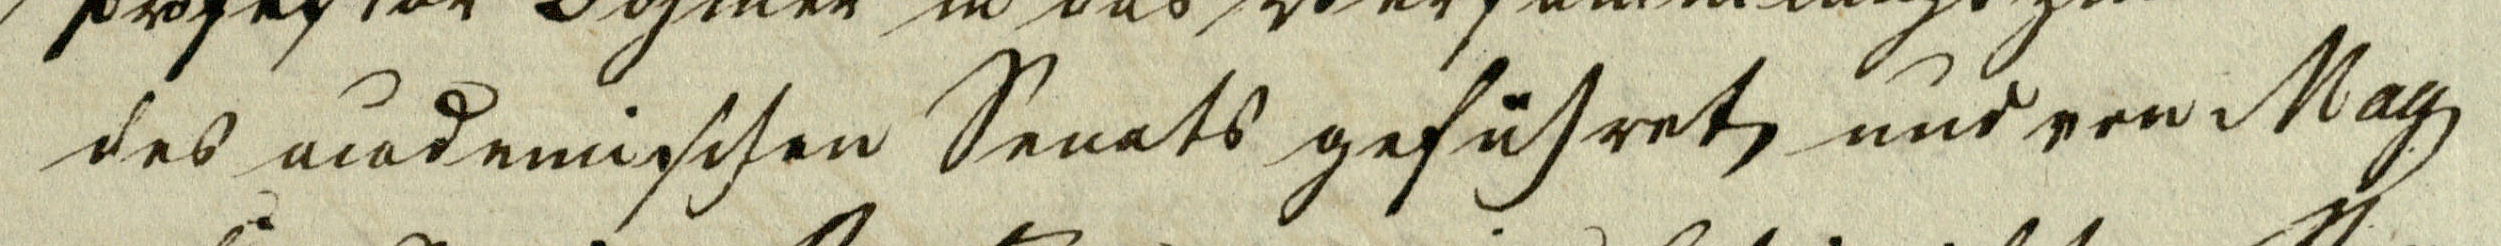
des academischen Senats geführet und von Mag¬
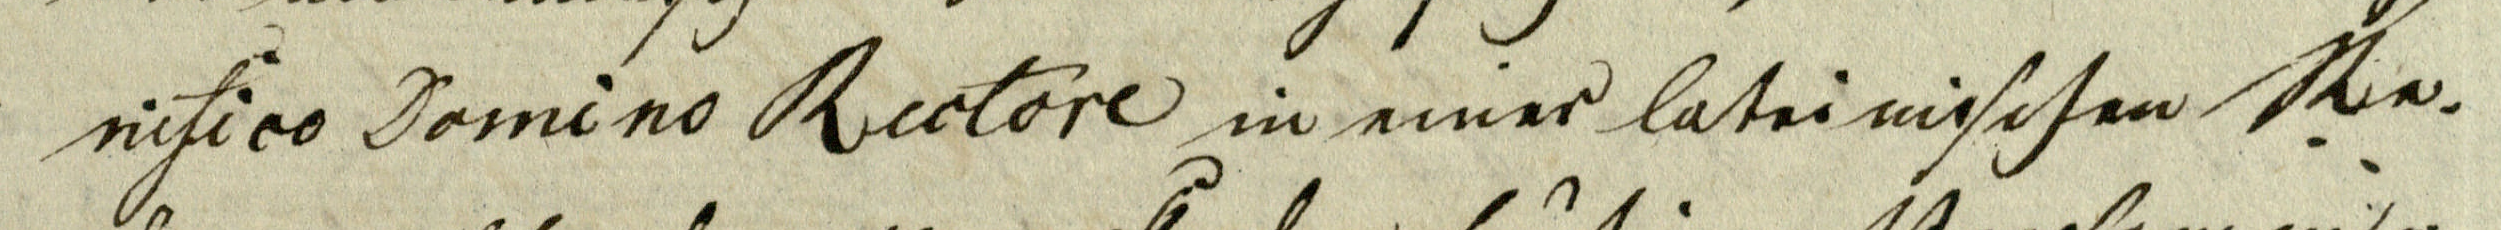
nifico Domino Rectore in einer lateinischen Re¬
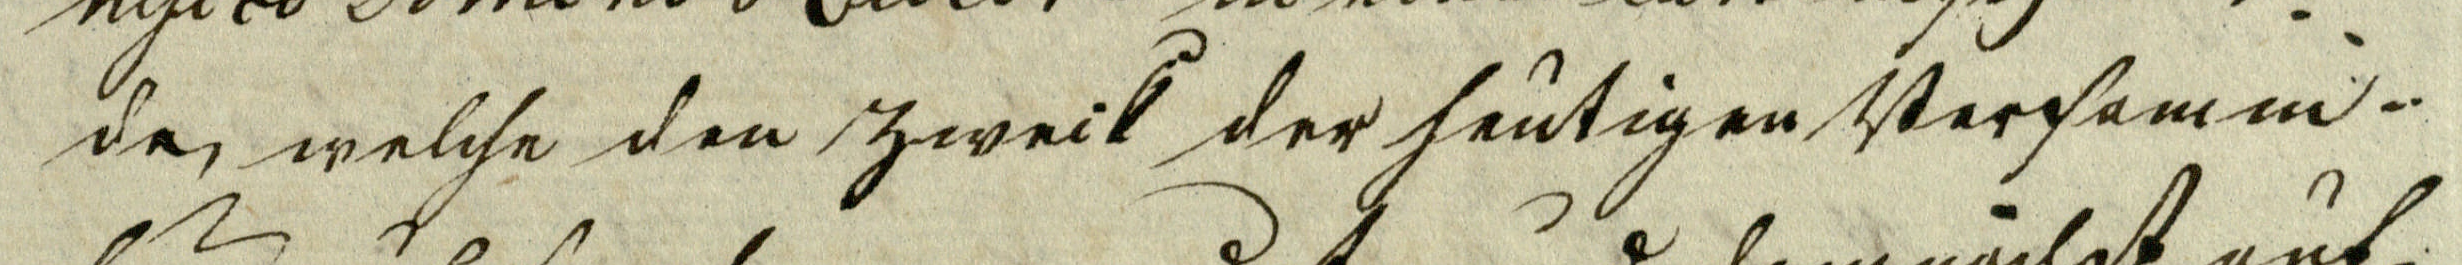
de welche den Zweck der heutigen Versamm¬
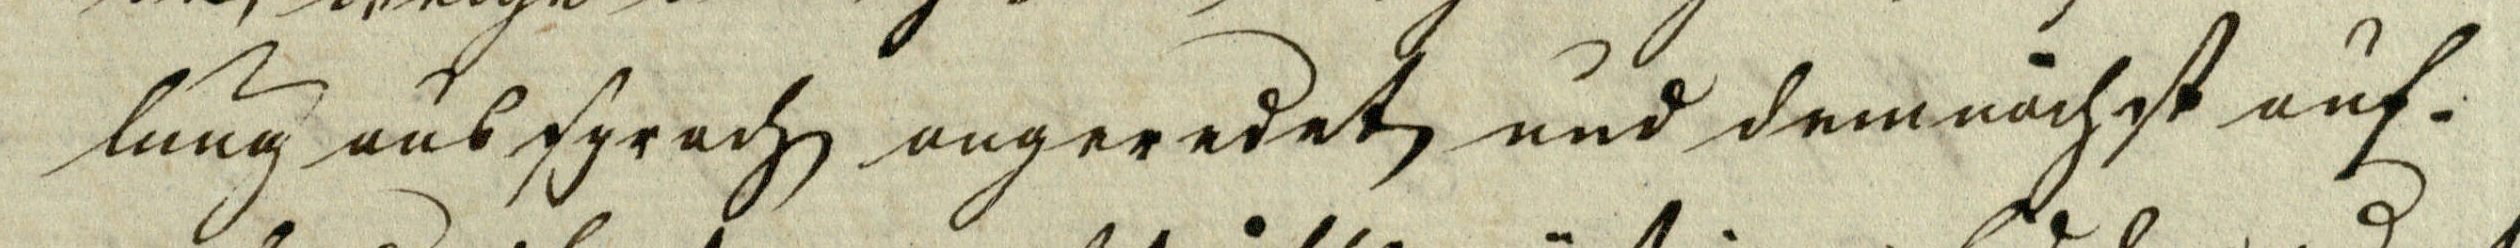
lung aussprach angeredet und demnächst auf¬
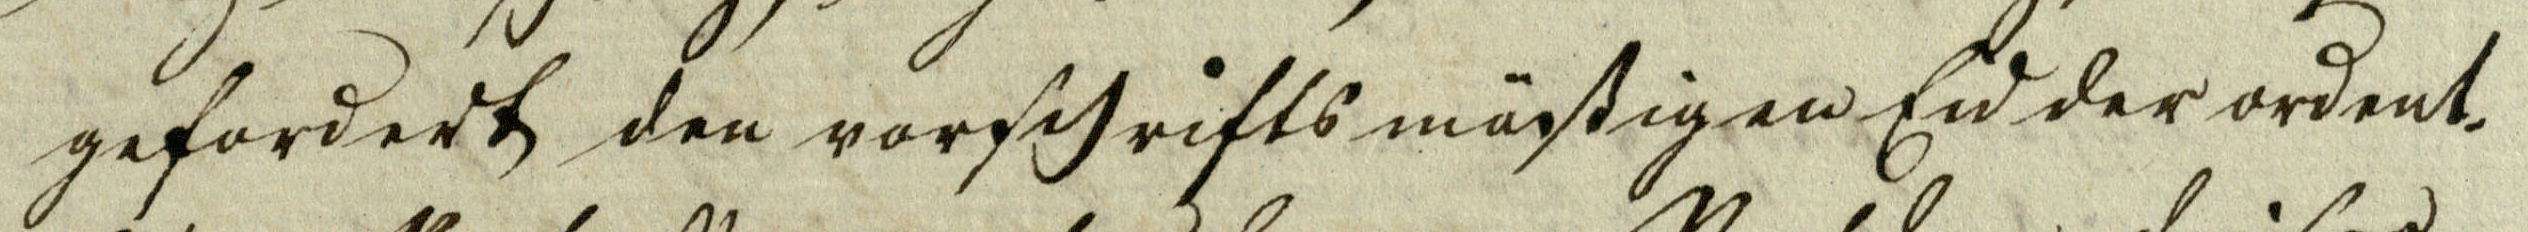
gefordert, den vorschriftsmäßigen Eid der ordent¬
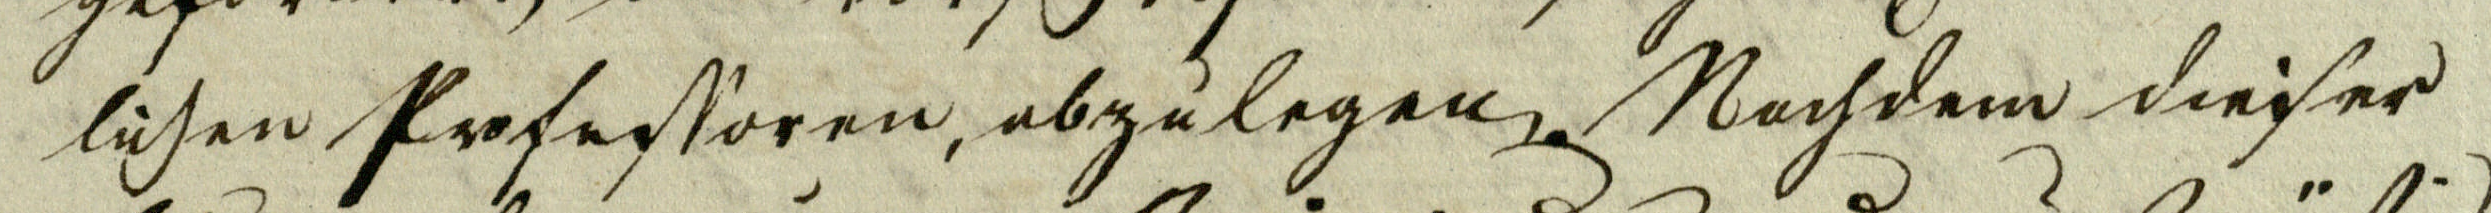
lichen Professoren abzulegen. Nachdem dieser
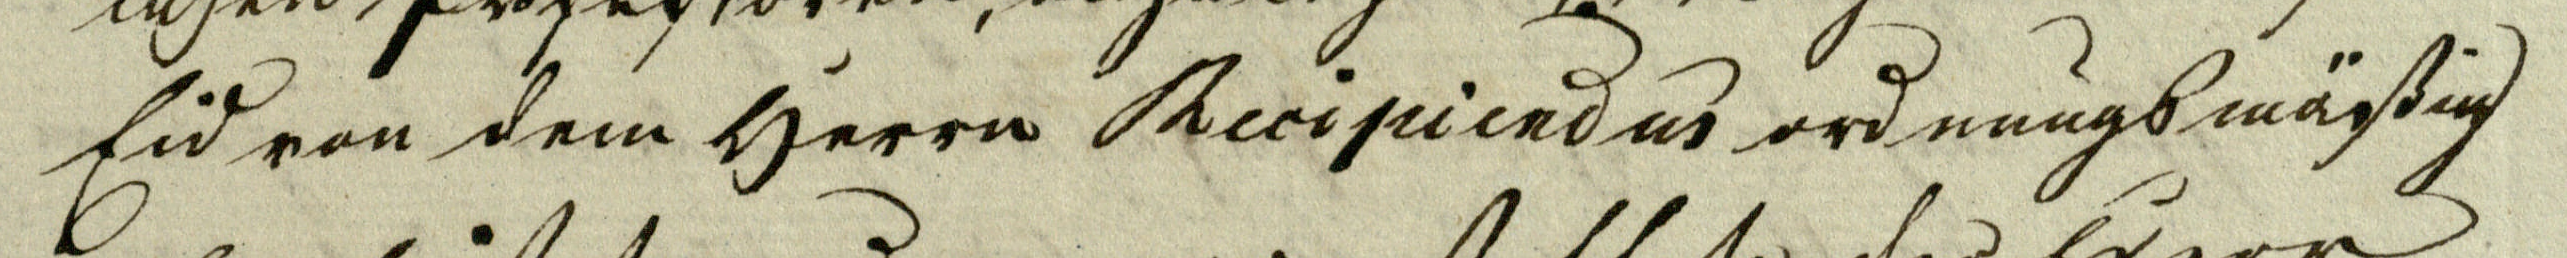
Eid von dem Herrn Recipiendus ordnungsmäßig
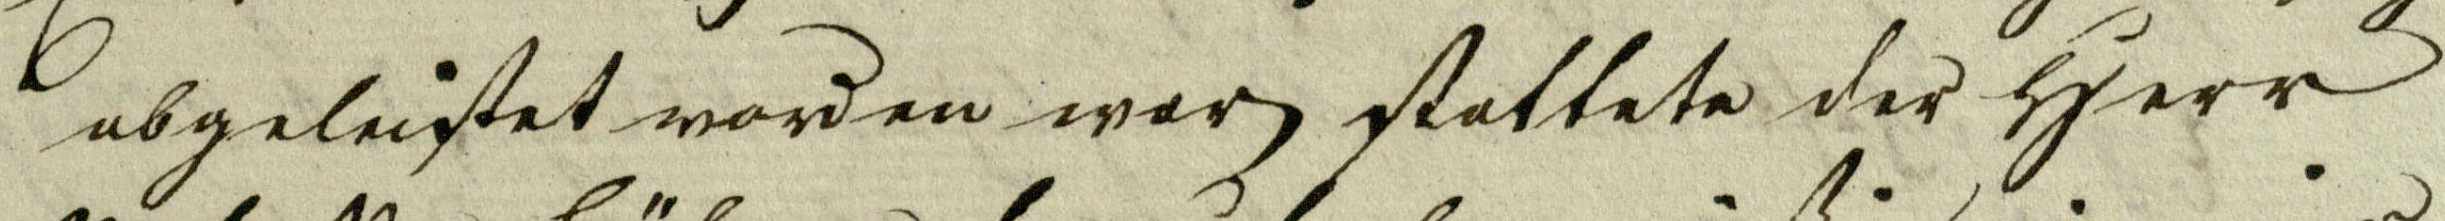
abgeleistet worden war stattete der Herr
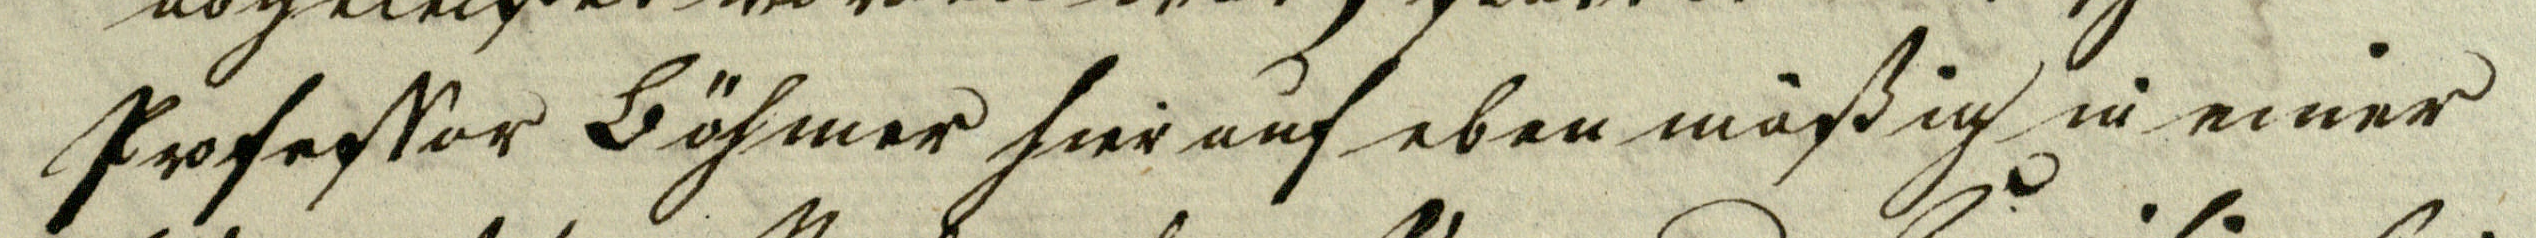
Professor Böhmer hierauf eben mäßig in einer
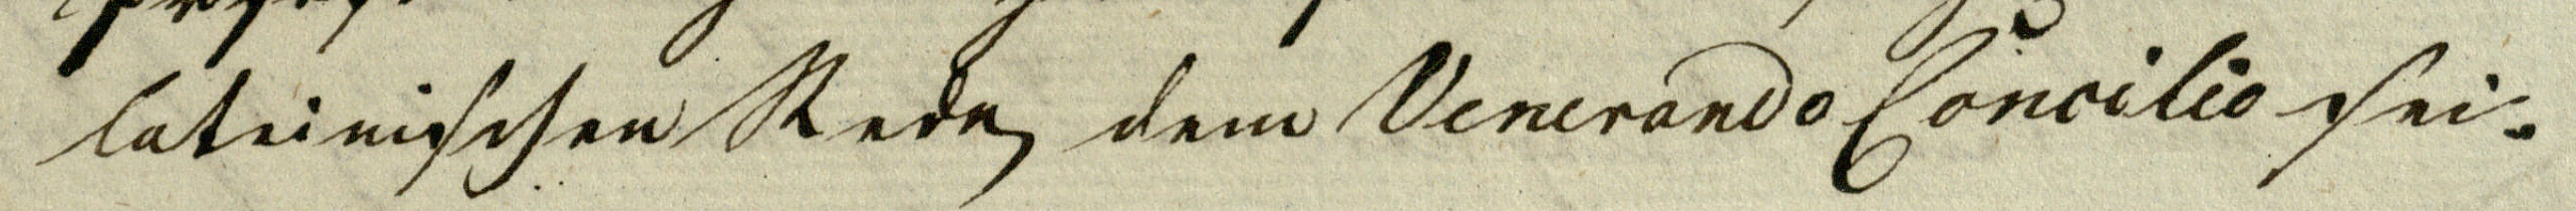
lateinischen Rede dem Venerando Concilio sei¬
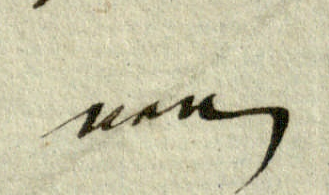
nen
